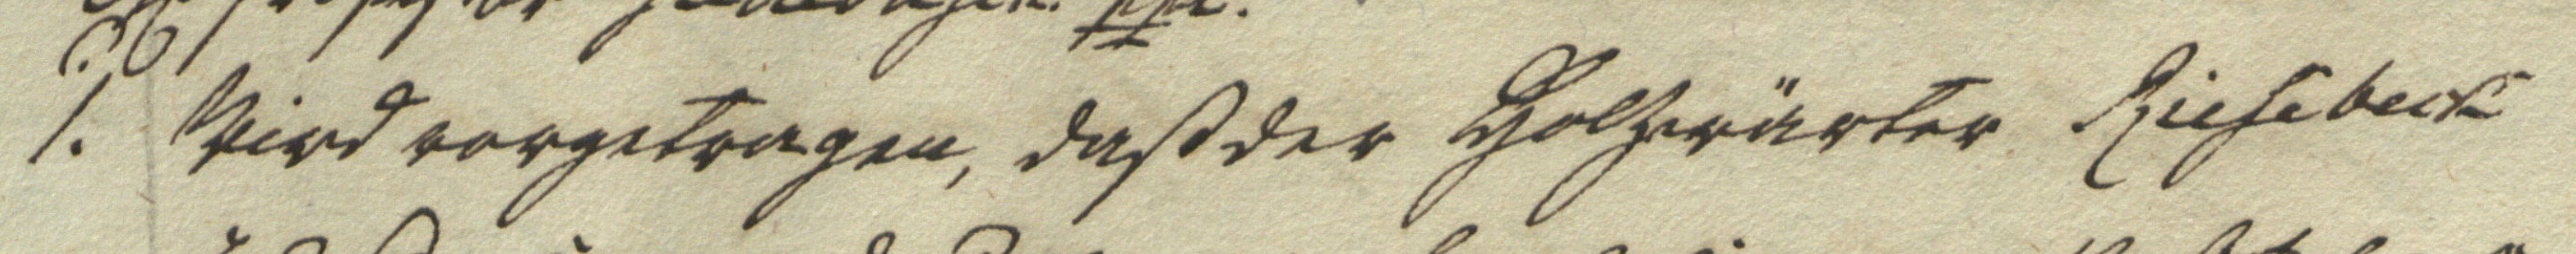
1. Wird vorgetragen, daß der Holzwärter Riesebeck
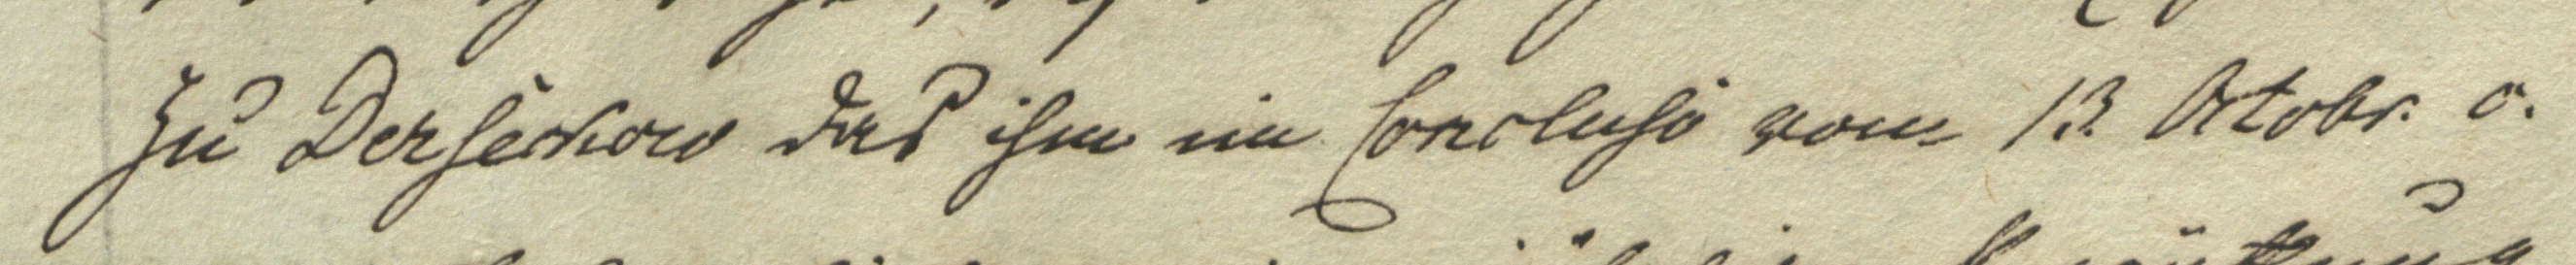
zu Derseckow das ihm im Concluso vom 12 Octobr. c.
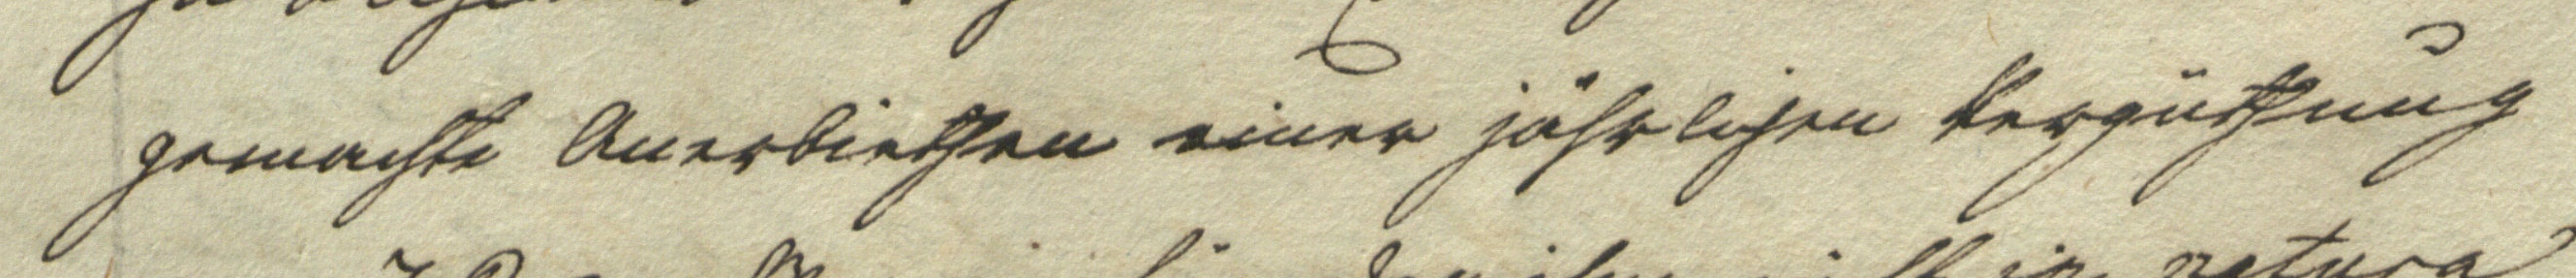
gemachte Anerbiethen einer jährlichen Vergüthung
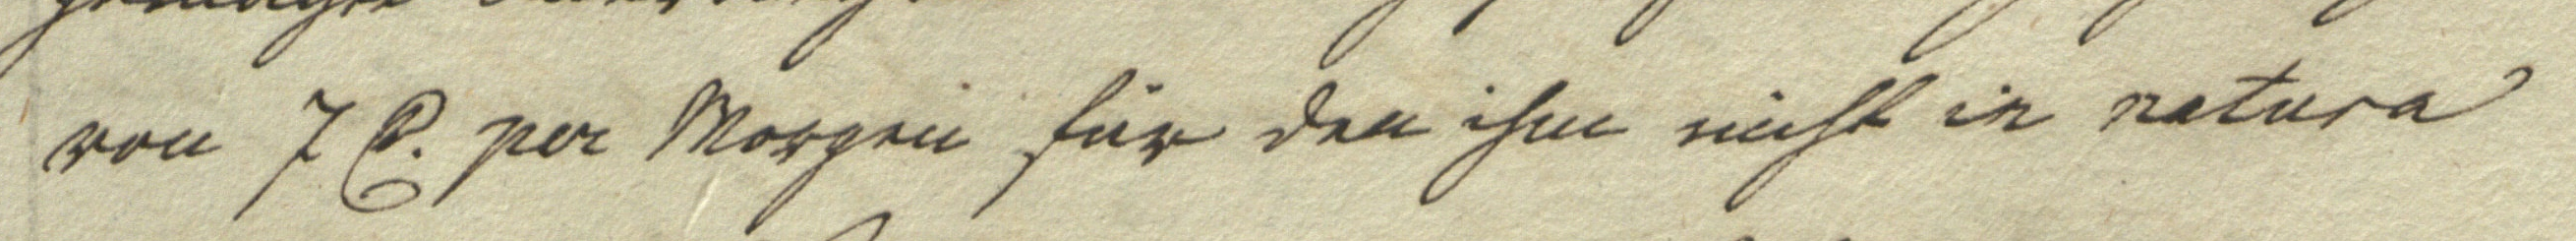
von 7 l. per Morgen für den ihm nicht in natura
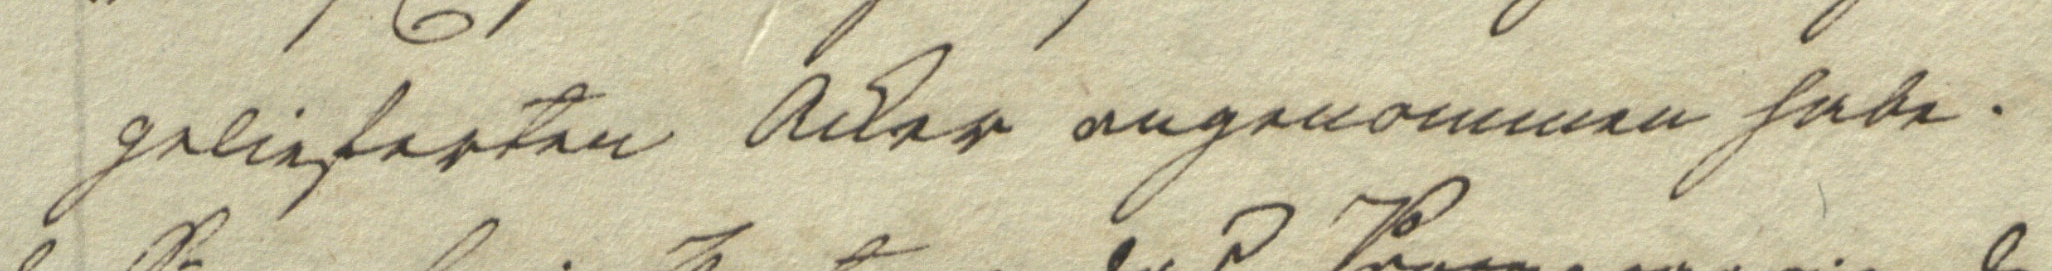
gelieferten Acker angenommen habe.
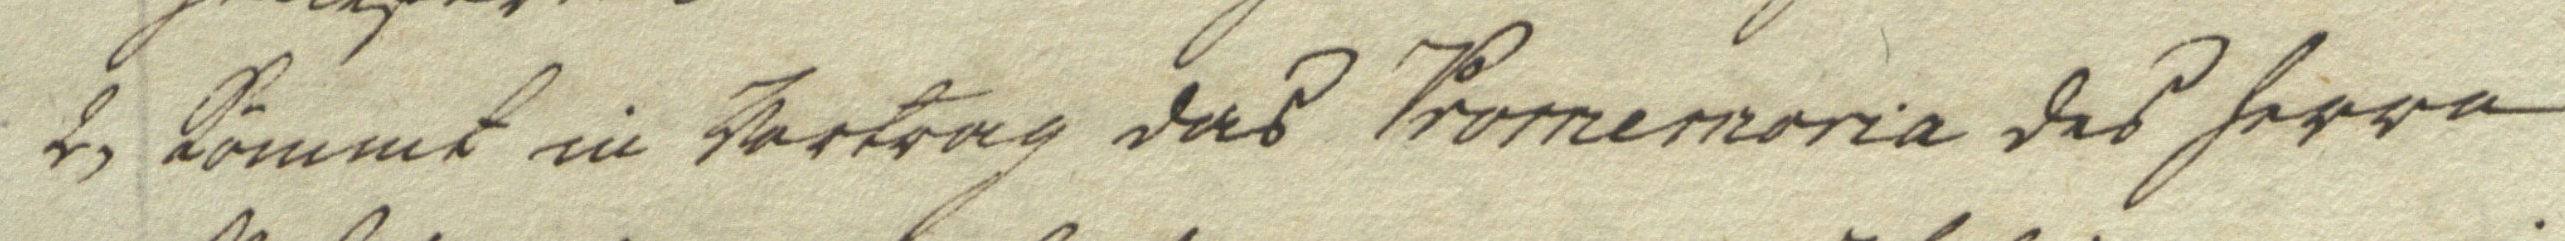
2, Kömmt in Vortrag das Promemoria des Herrn
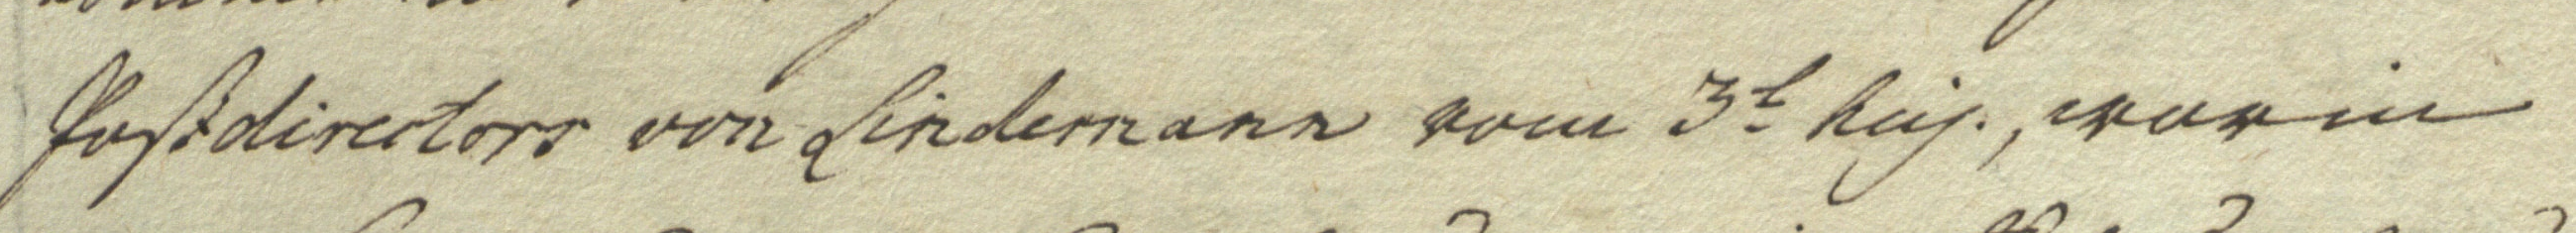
Postdirectors von Lindemann vom 3 t huj., worin
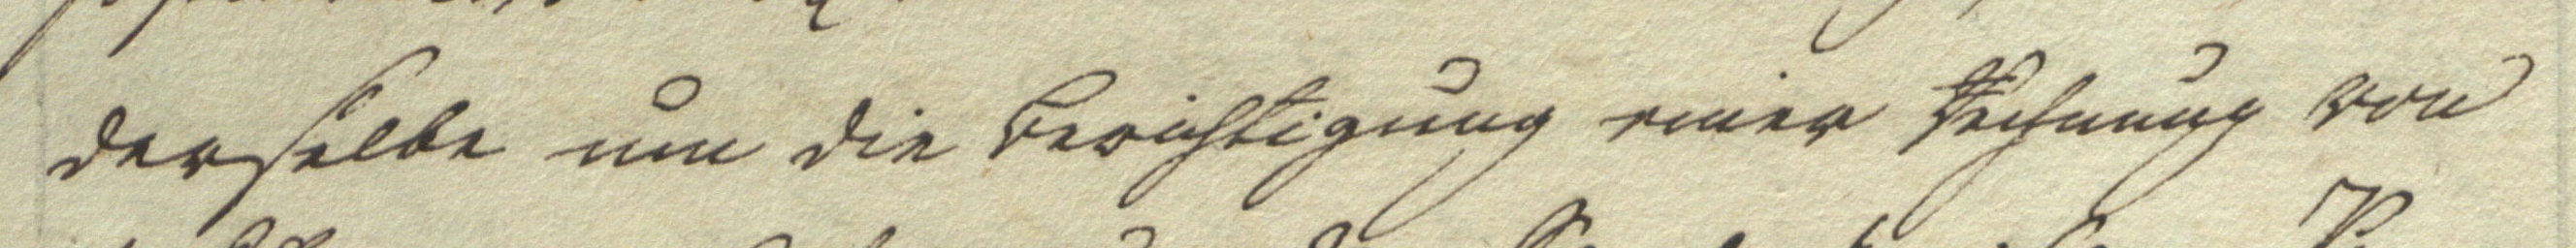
derselbe um die Berichtigung einer Rechnung von
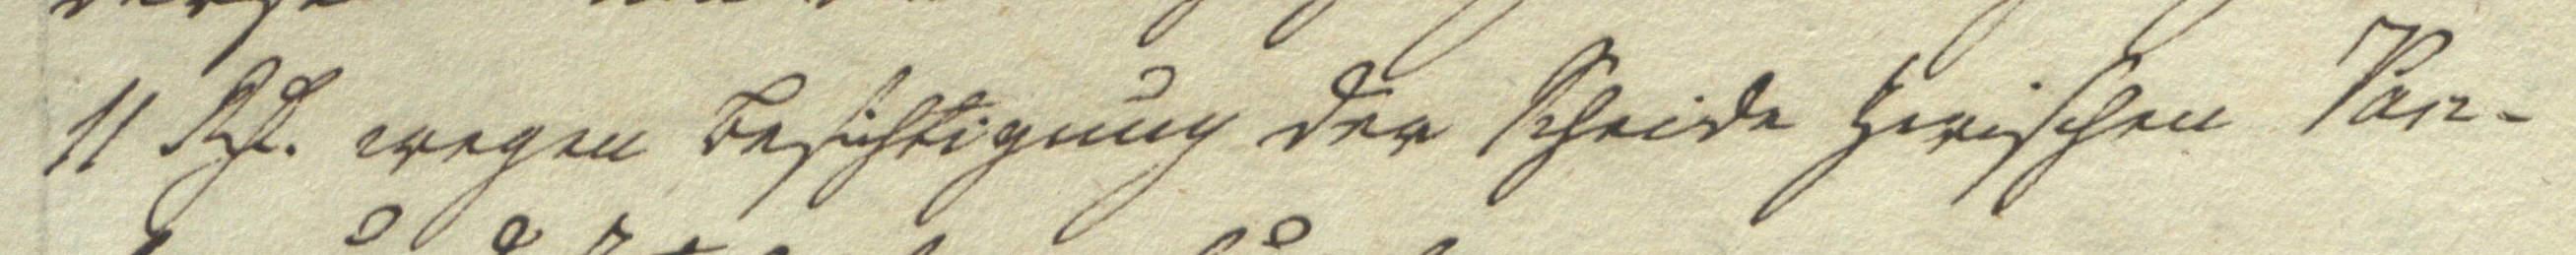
11 Rf. wegen Besichtigung der Scheide zwischen Pan¬
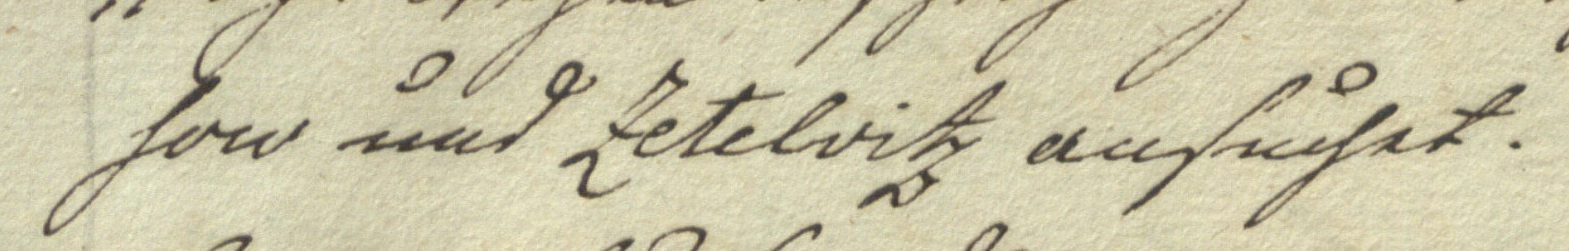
sow und Zetelvitz ansuchet.
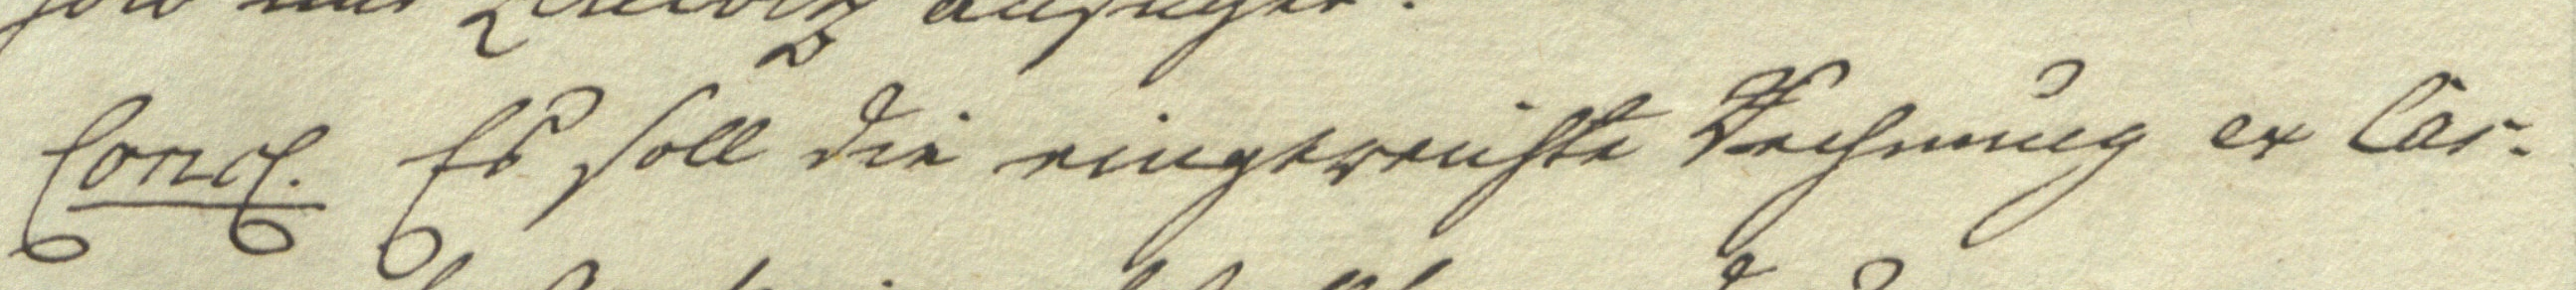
Concl. Es soll die eingereichte Rechnung ex Cas¬
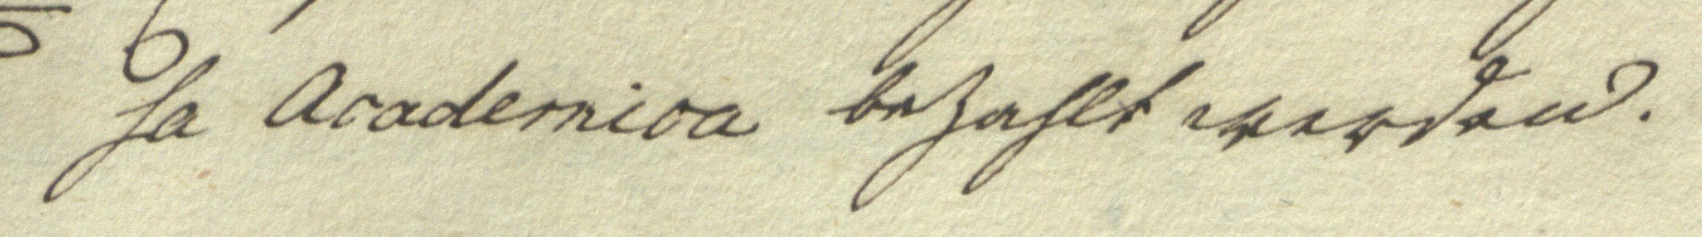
sa Academica bezahlt werden.
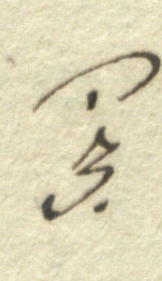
3.
